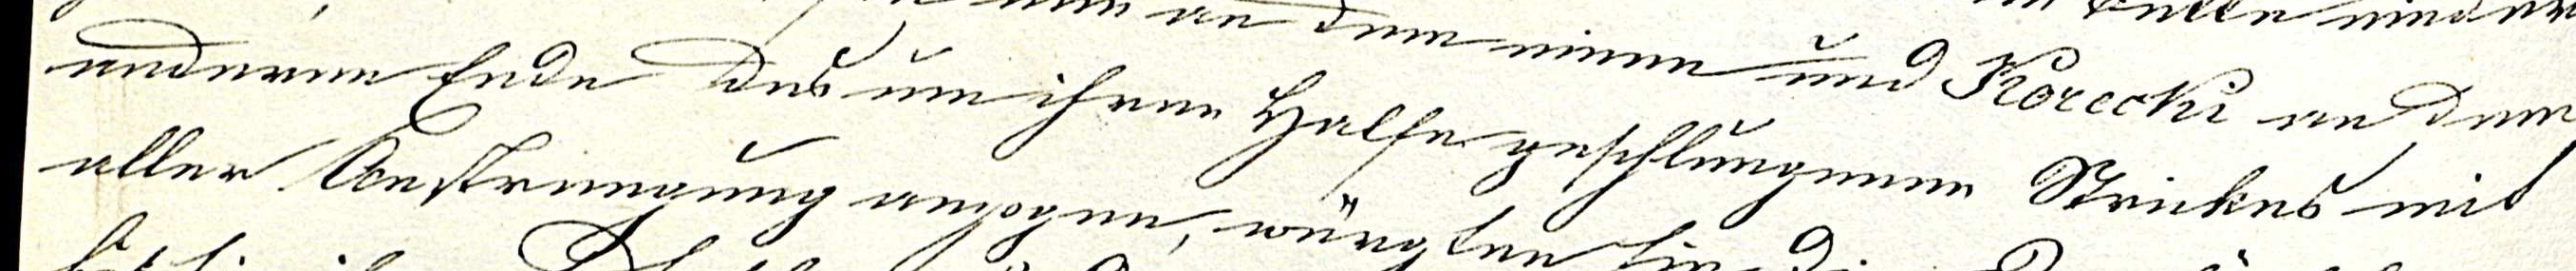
anderem Ende des um ihren Halfe geschlungenen Strickes mit
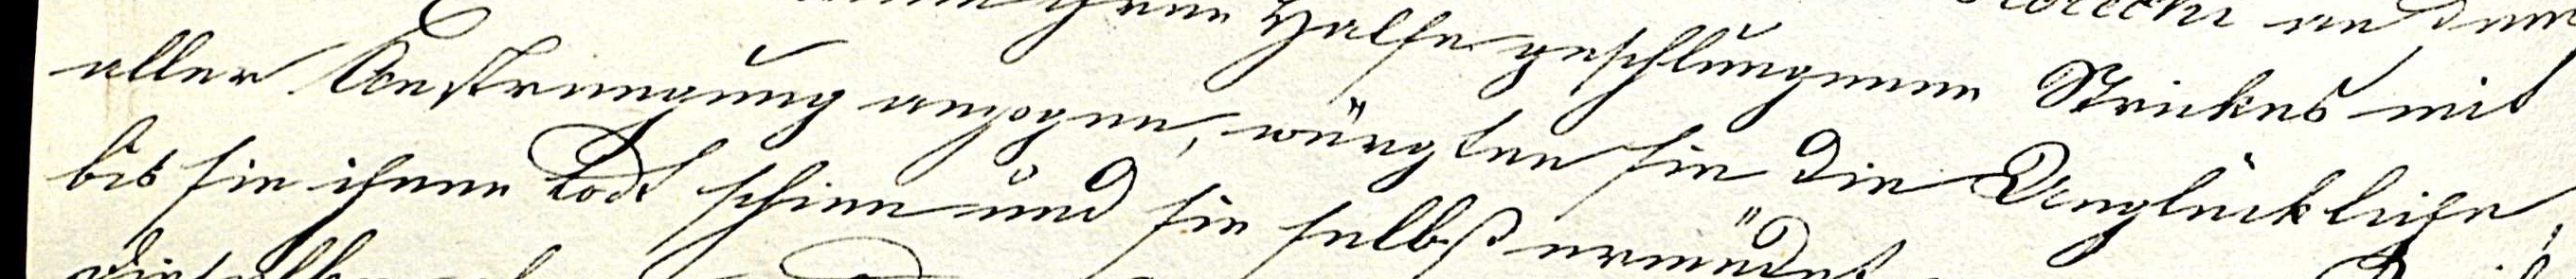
aller xx anzogen, würgten sie die Unglückliche,
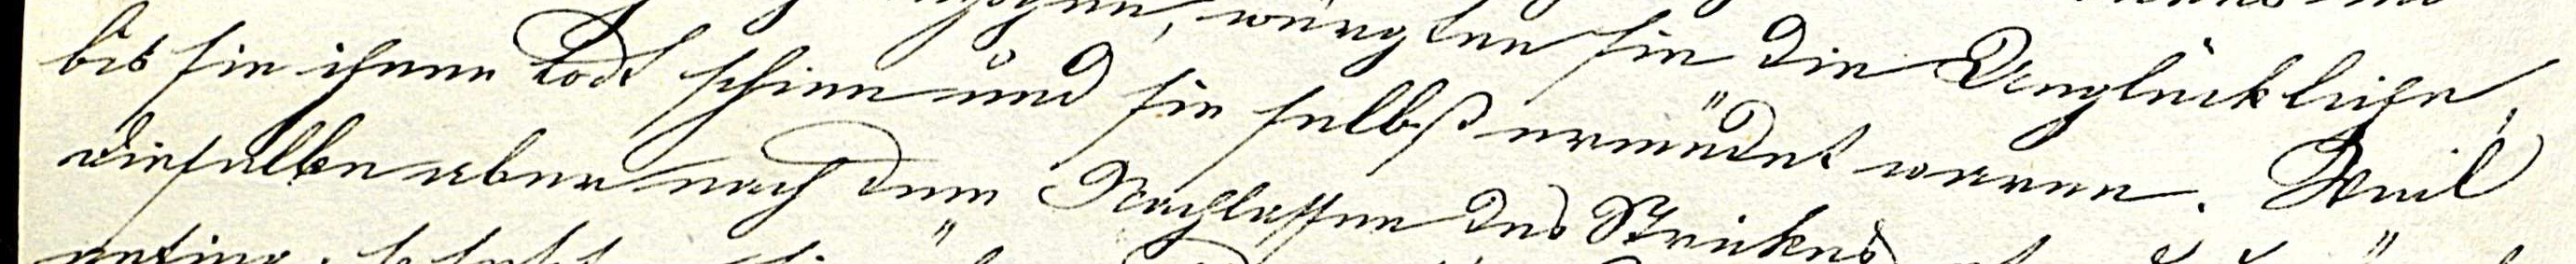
bis sie ihren todt schien und sie selbst ermüdet waren. Weil
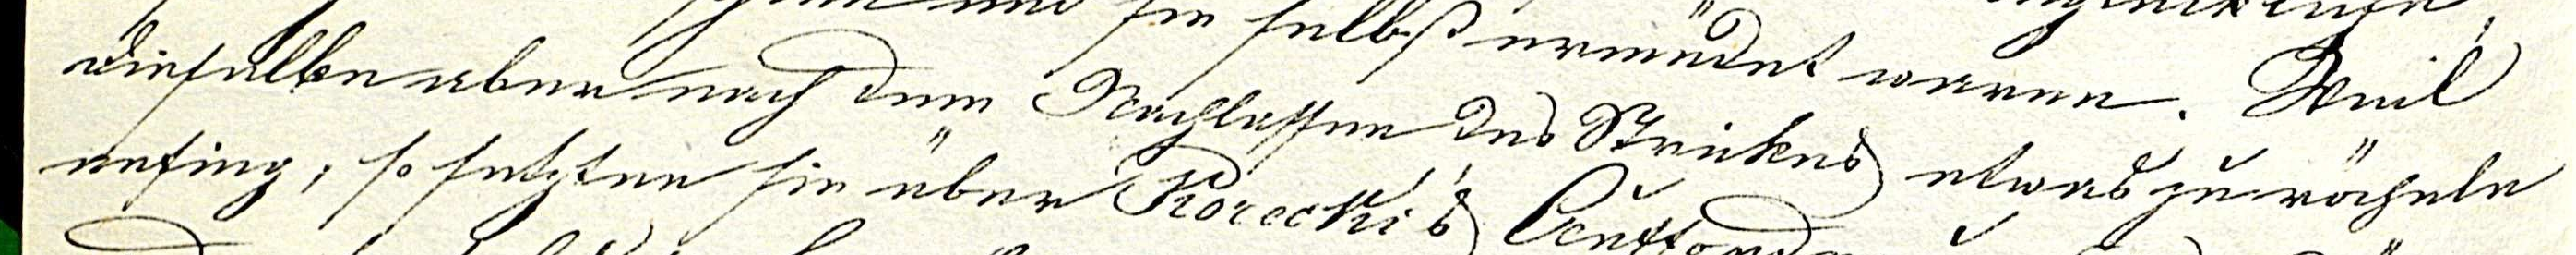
dieselbe aber nach dem Nachlassen des Strickes etwas zuröchele
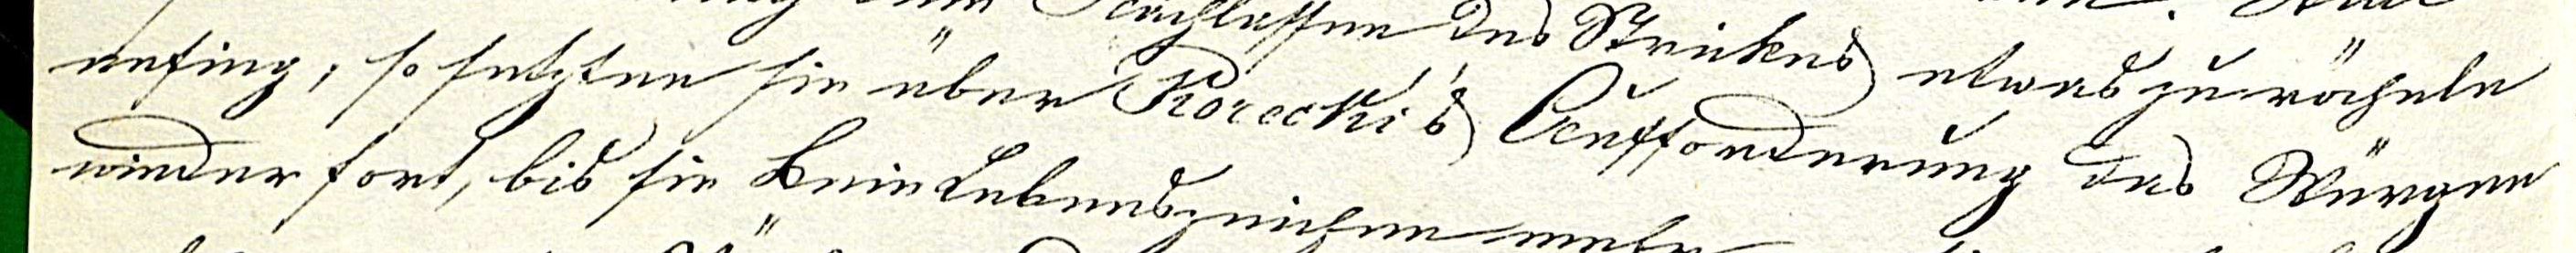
xxfing, so setzten sie über Korecki's Aufforderung des Würgen
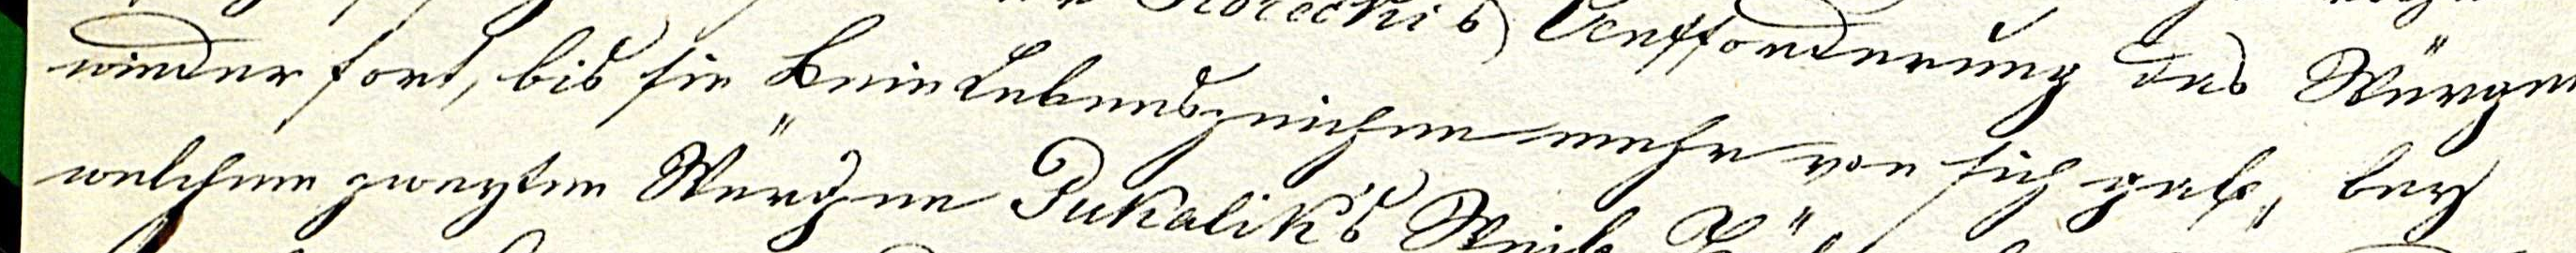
wieder fort, bis sie Bein Lebenszeichen mehr von sich gab, bey
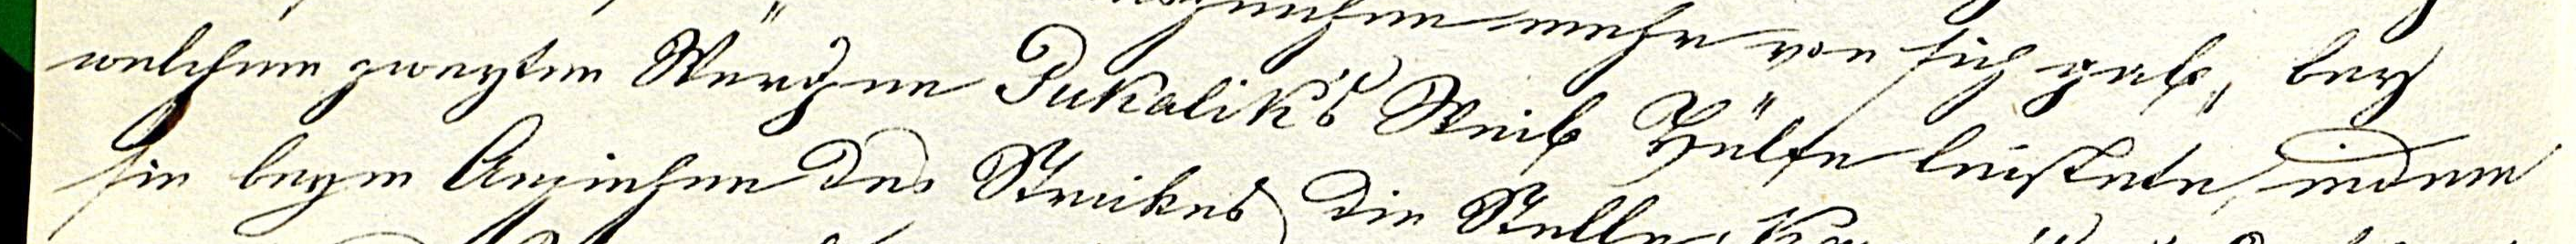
welchem zweyten Würdzen Pukalik's Weib Hülfe leistete, indem
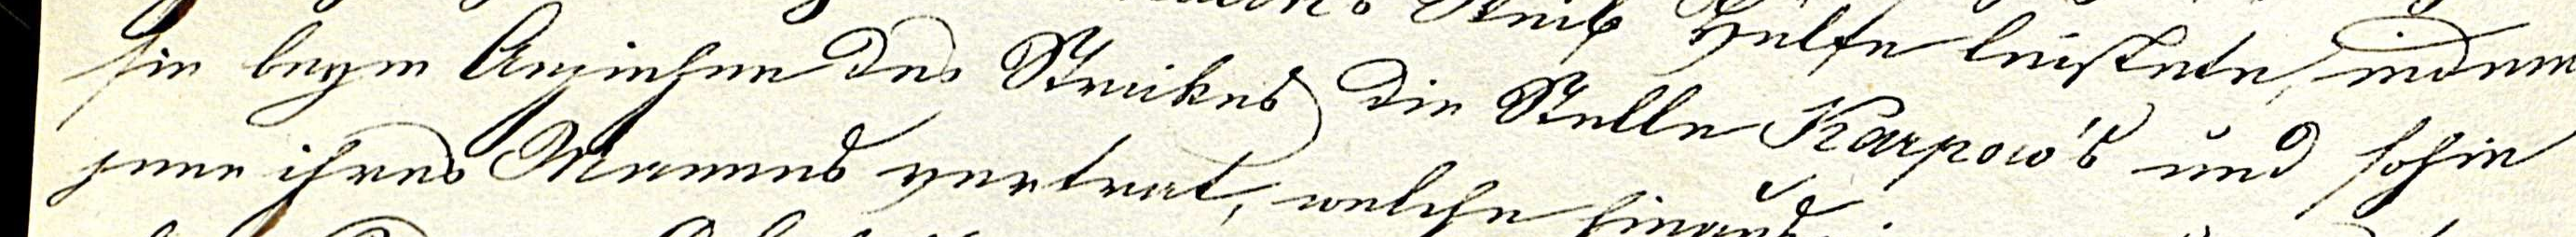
sie beym Anziehen des Strickes die Stelle Karpow's und sohin
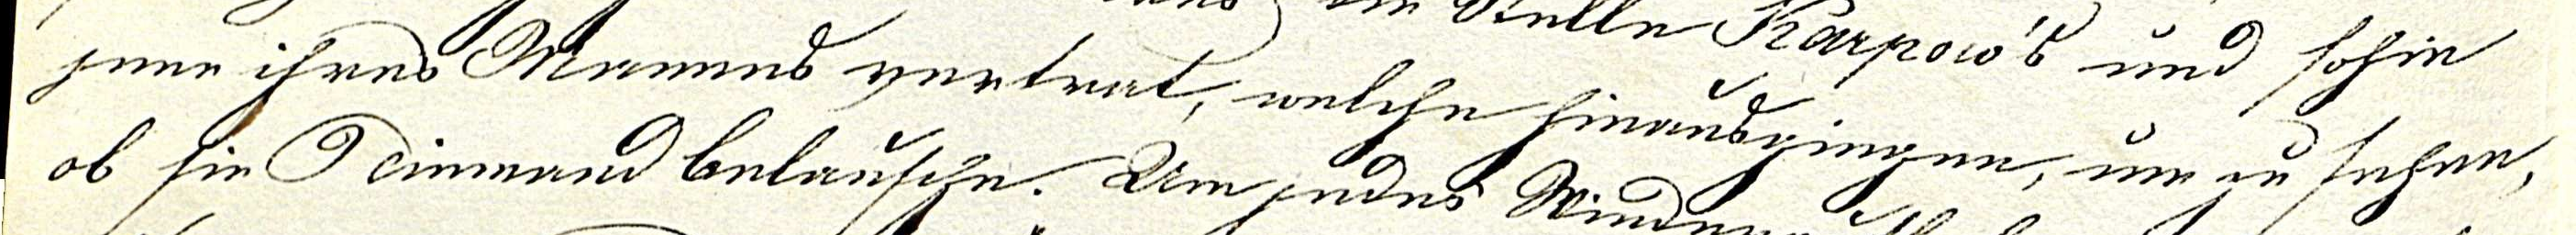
xx ihres Mannes vertrat, welche hinausgingen, um zu sehen,
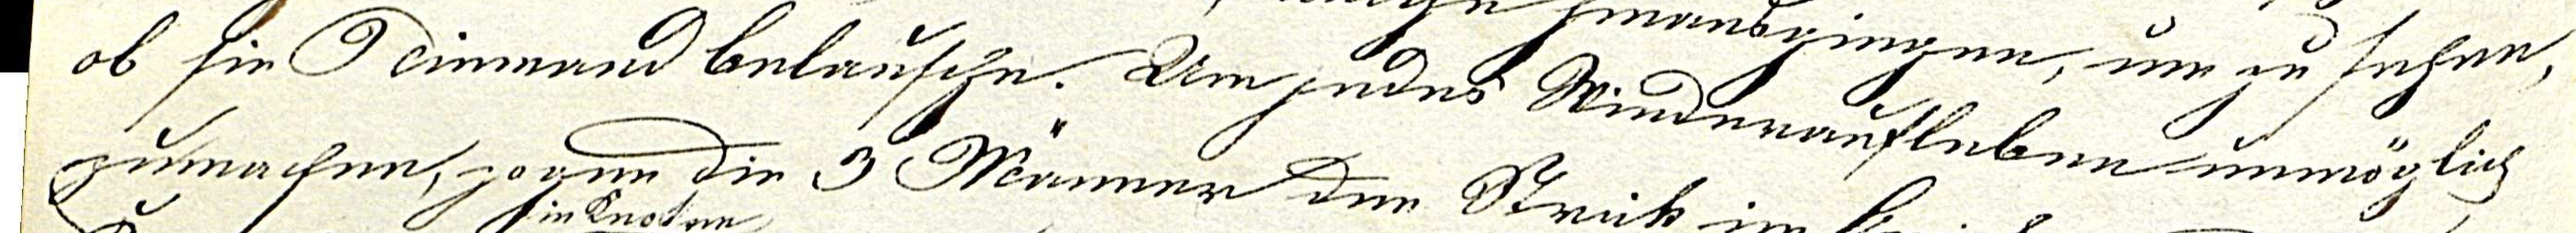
ob sie Niemand belausche. Um jedes Wiederaufleben unmöglich
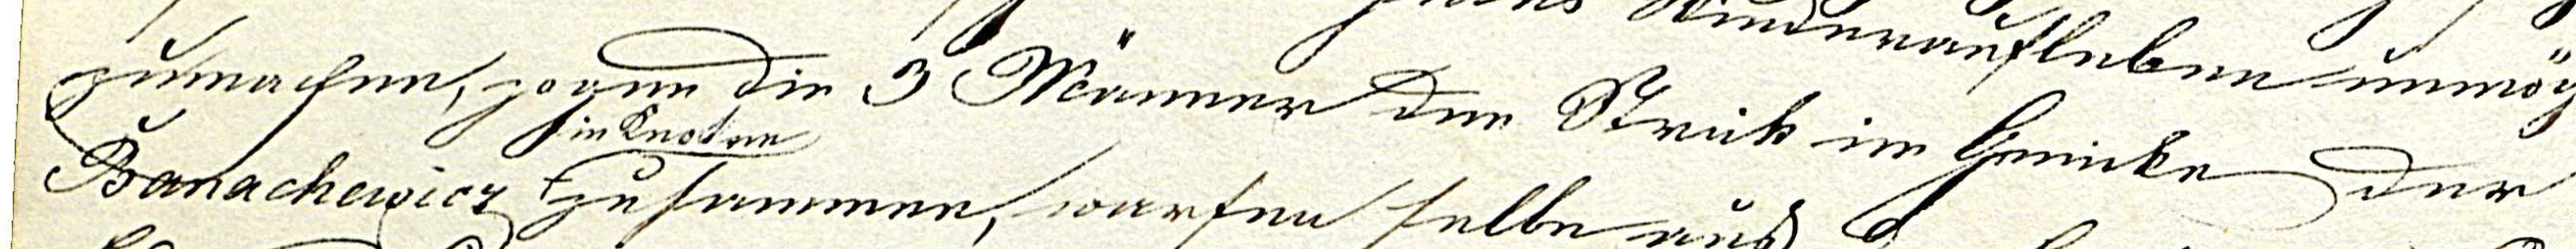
zumachen, zogen die 3 Männer den Strick in Genicke der
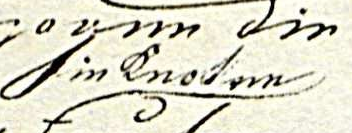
in Knotan
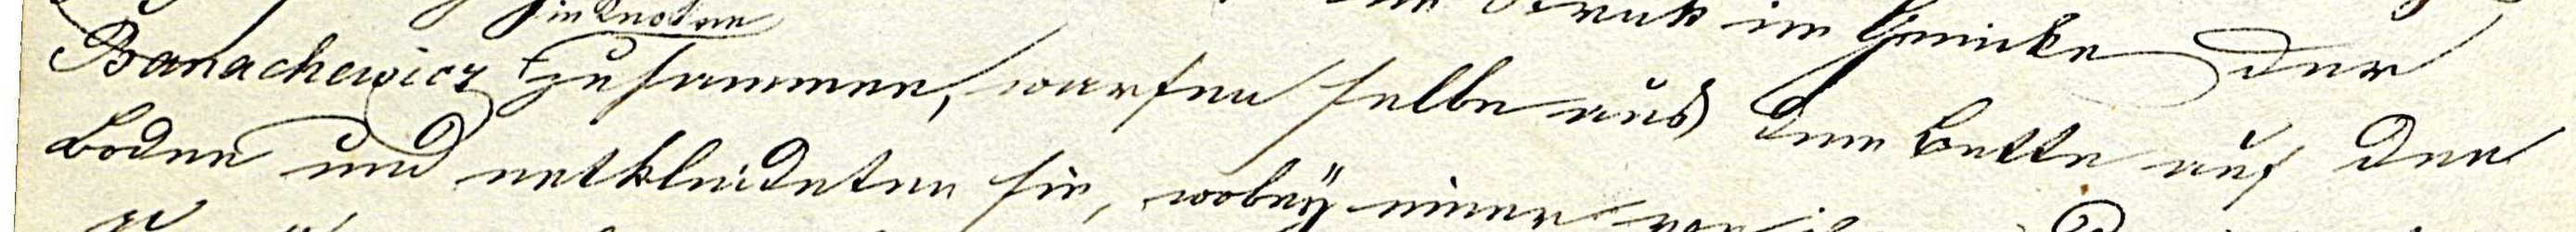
Banachewicz zusammen, warfen selbe aus dem Bette auf den
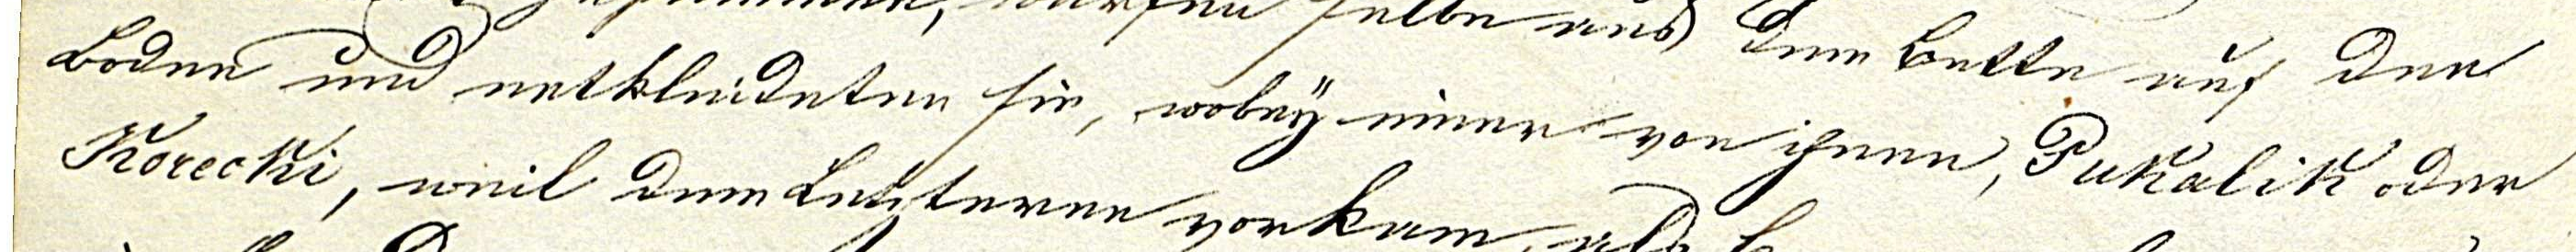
Boden und mitkleideten für, wobey einer von ihnen, Pukalik oder
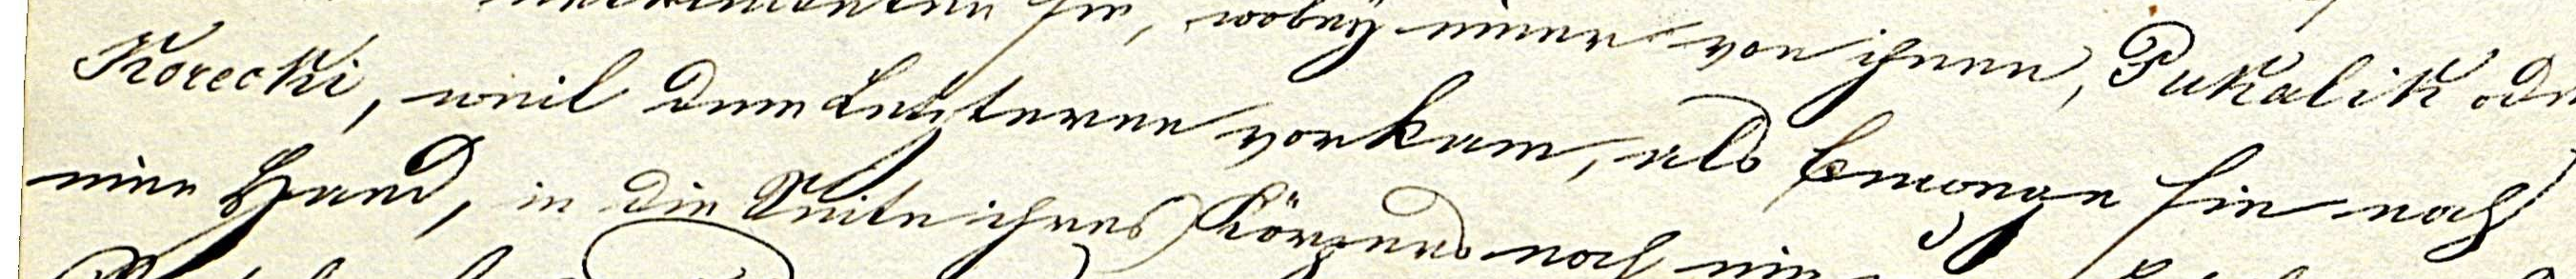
Korecki, weil dem Letzteren vorkam, als bewege sie noch
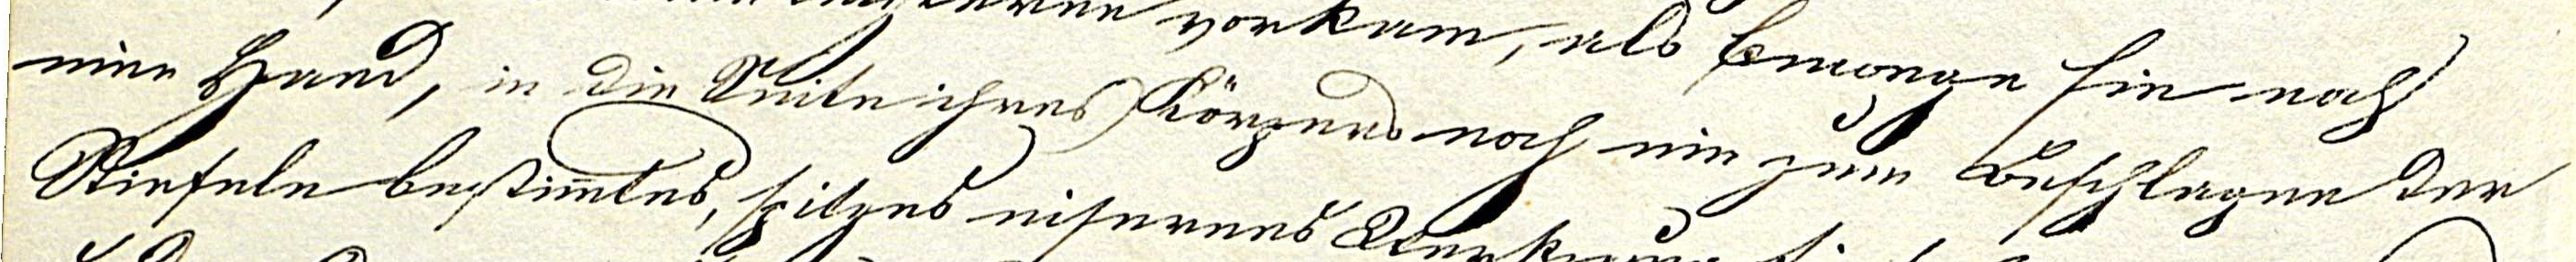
eine Hand, in die Seite ihres Körpers noch ein zum Beschlagen der
